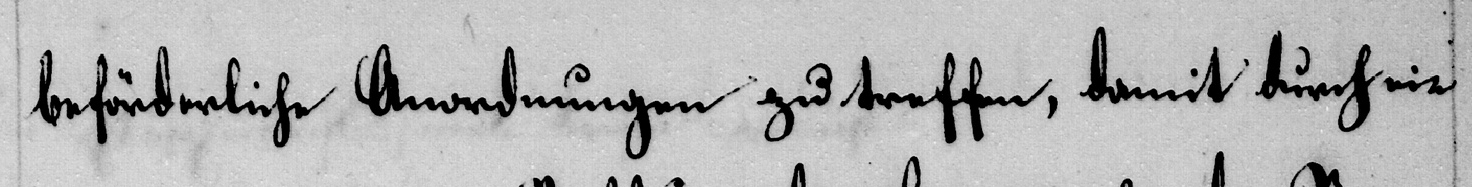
beförderliche Anordnungen zu treffen, damit durch ei¬
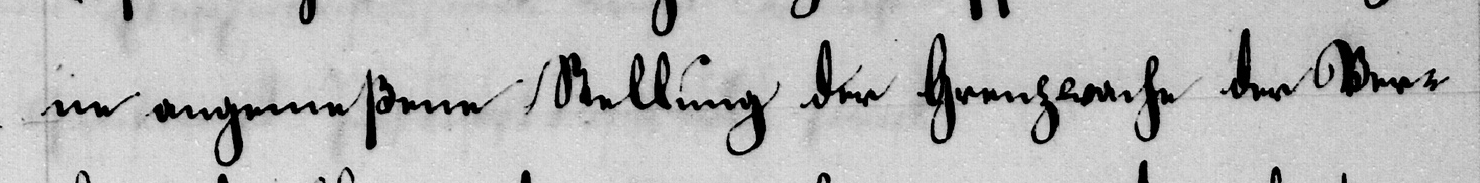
ne angemeßene Stellung der Grenzwache der Ver¬
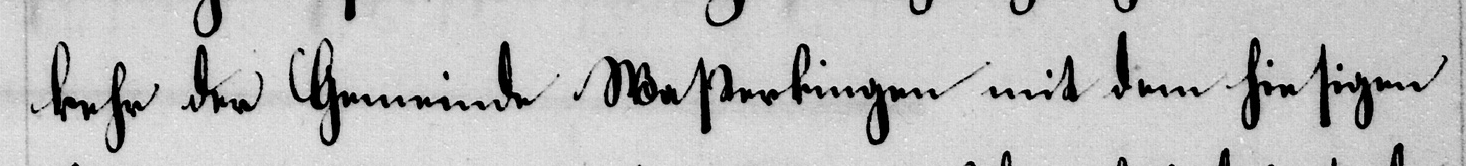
kehr der Gemeinde Wasterkingen mit dem hiesigen
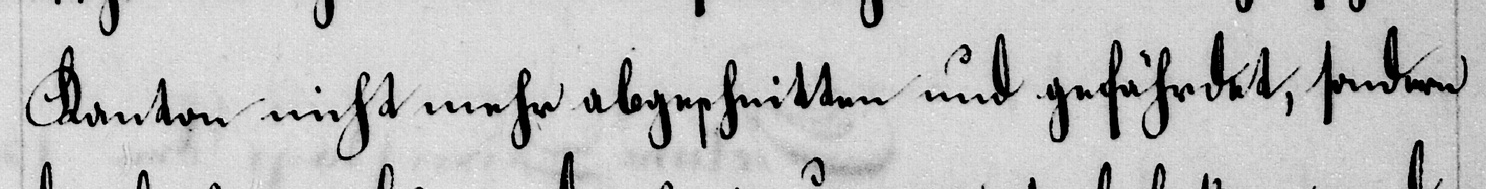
Kanton nicht mehr abgeschnitten und gefährdet, sondern
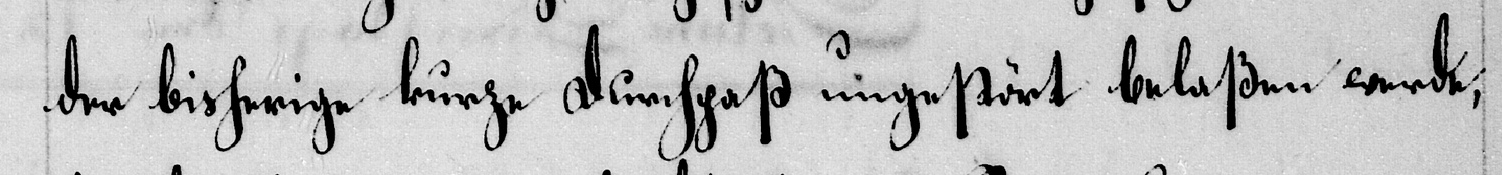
der bisherige kurze Durchpaß ungestört belaßen werde,
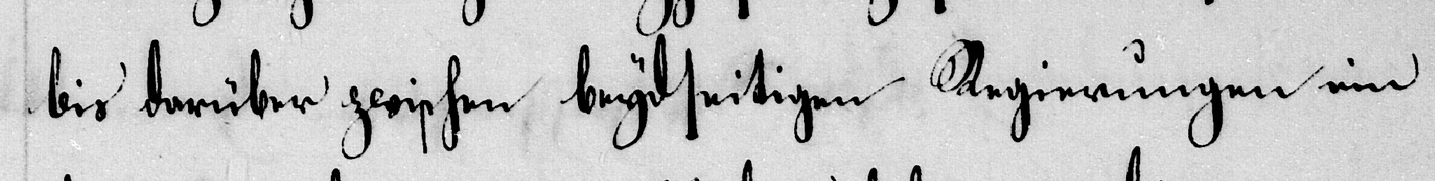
bis darüber zwischen beydseitigen Regierungen ein
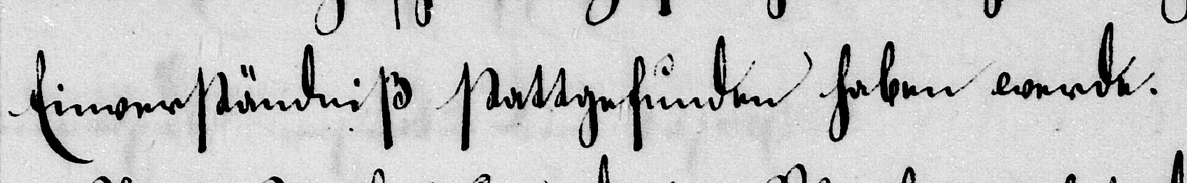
Einverständniß stattgefunden haben werde.
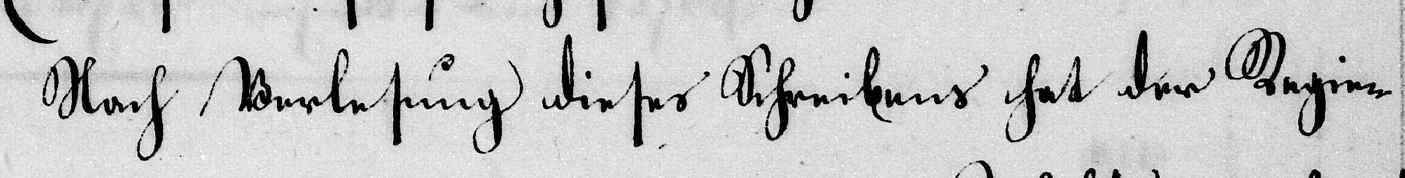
Nach Verlesung dieses Schreibens hat der Regie¬
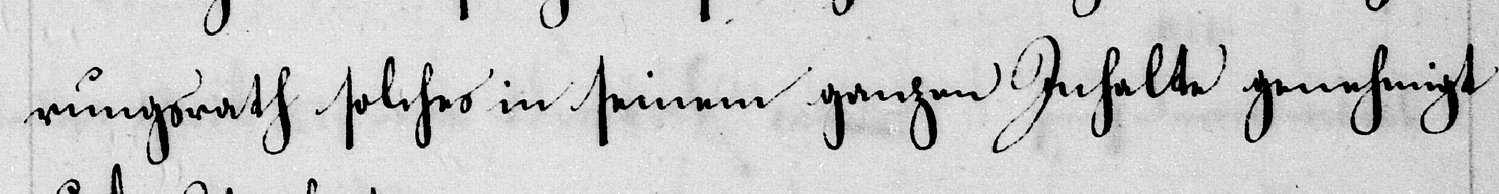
rungsrath solches in seinem ganzen Inhalte genehmigt
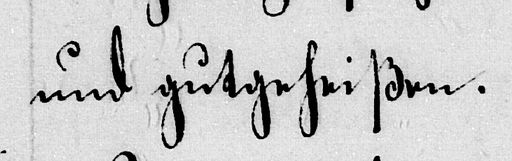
und gutgeheißen.
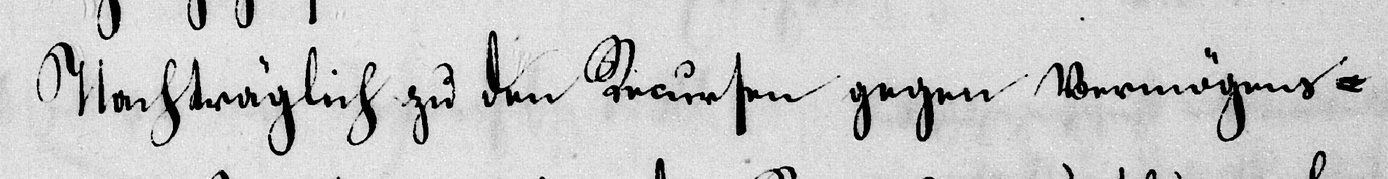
Nachträglich zu den Recursen gegen Vermögens¬
